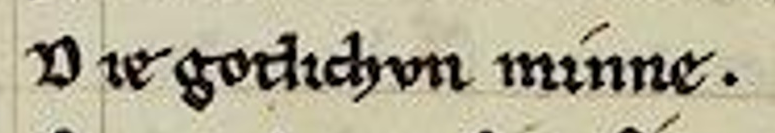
Die gotlichvn minne.
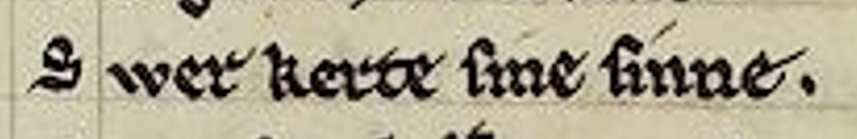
Swer kerte ſine ſinne.
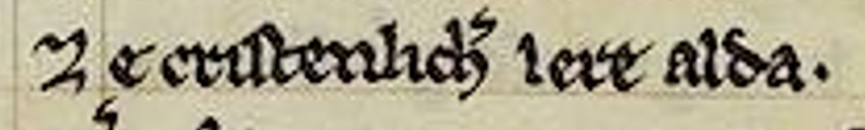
Ze criſtenlich(er) lere alda.
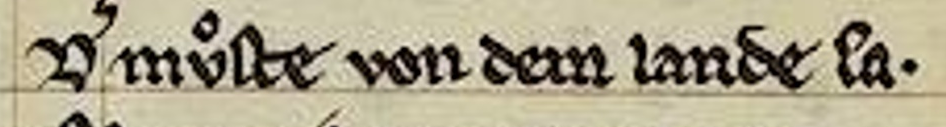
D(er) mv°oſte von dem lande ſa.
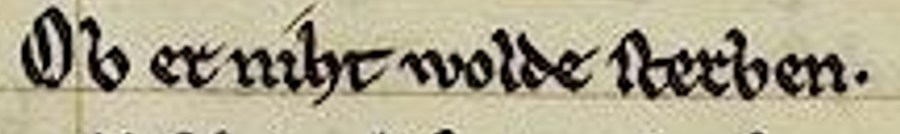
Ob er niht wolde ſterben.
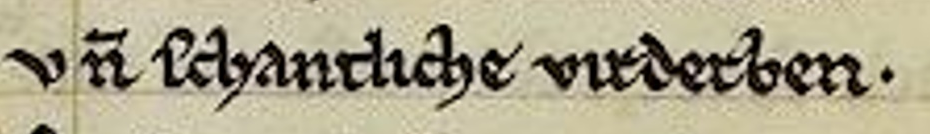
Vn(d) ſchantliche virderben.
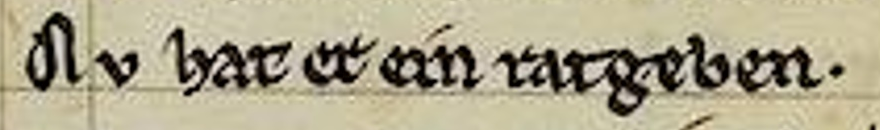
Nv hat er ein ratgeben.
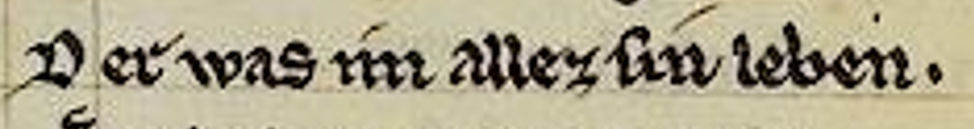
Der was im allez ſin leben.
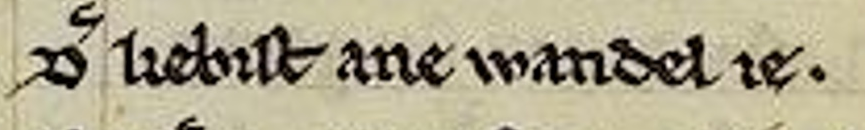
D(er) liebiſt ane wandel ie.
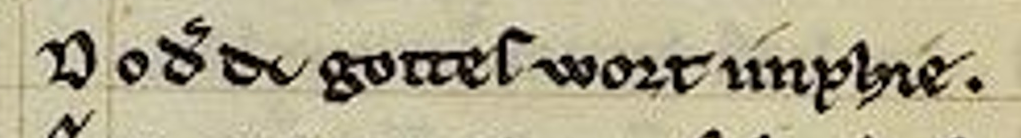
Do d(er) d(az) gotteſ wort imphie.
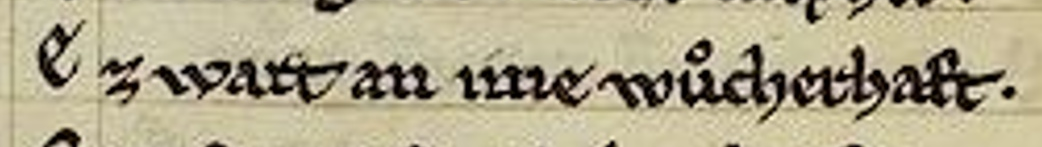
Ez wart an ime wu°ocherhaft.
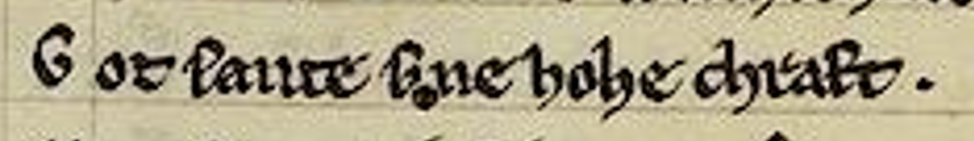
Got ſante ſine hohe chraft.
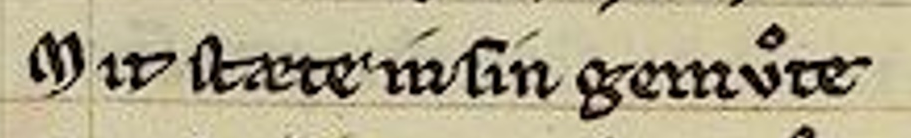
Mit ſt[ae]te in ſin gemv°ote
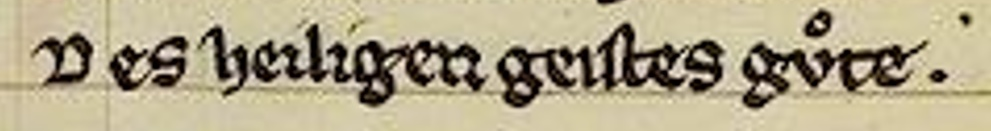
Des heiligen geiſtes gv°ote.
